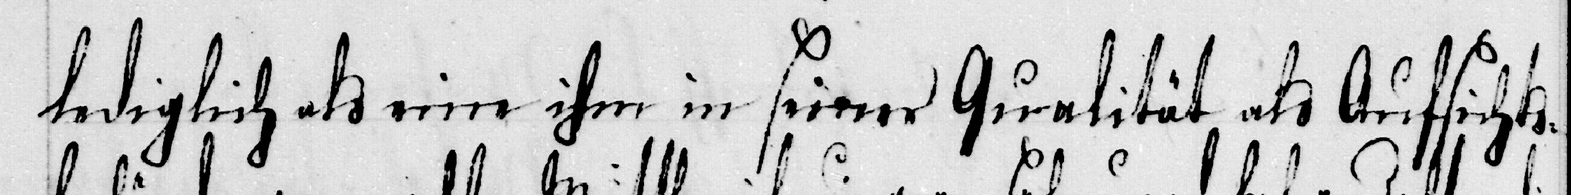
lediglich als eine ihm in seiner Qualität als Aufsichts¬
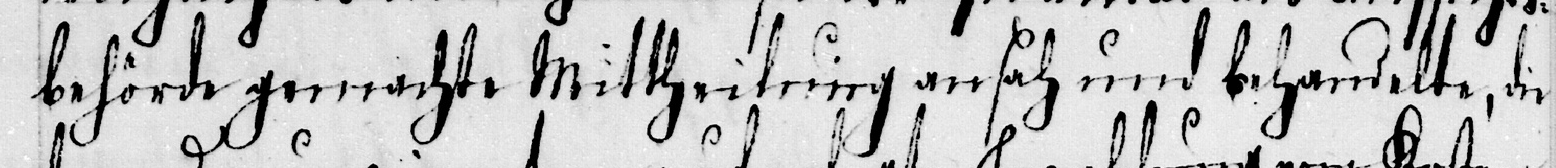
behörde gemachte Mittheilung ansah und behandelte, die
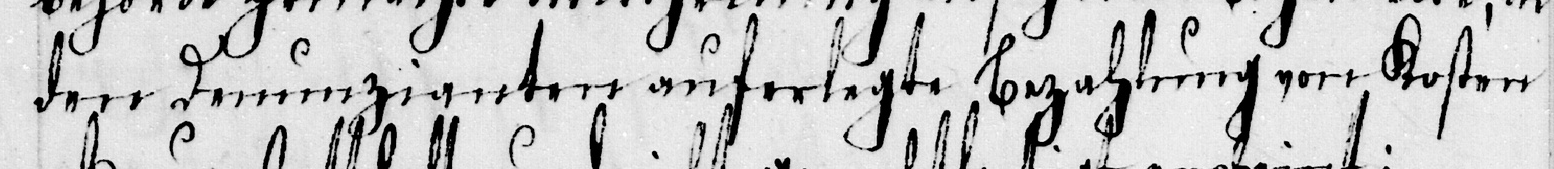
den Denunzianten auferlegte Bezahlung von Kosten
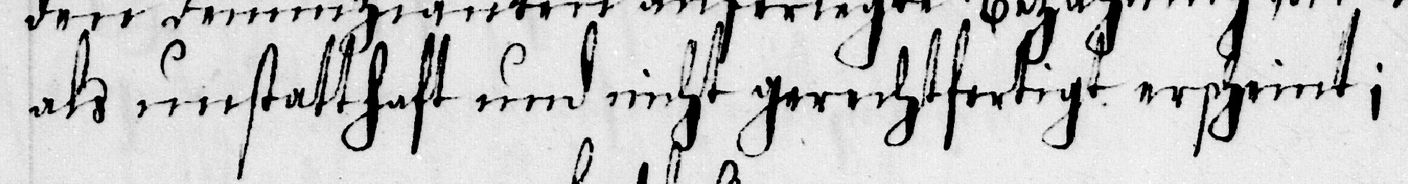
als unstatthaft und nicht gerechtfertigt erscheint;
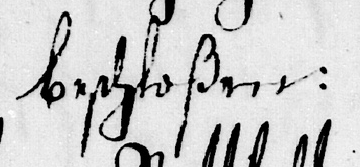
beschloßen:
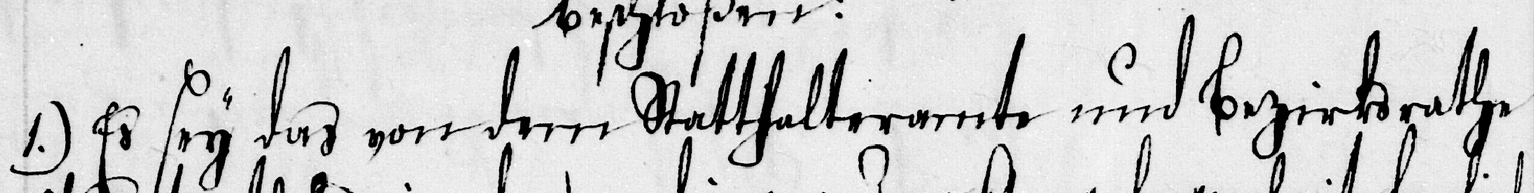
1.) Es sey das von dem Statthalteramte und Bezirksrathe
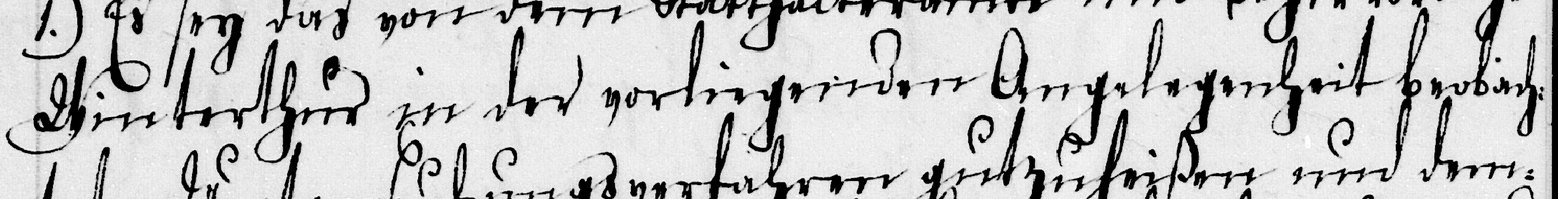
Winterthur in der vorliegenden Angelegenheit beobac¬
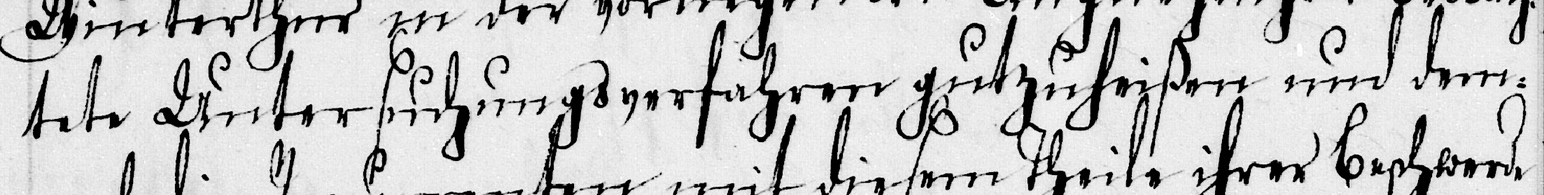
htete Untersuchungsverfahren gutzuheißen und dem¬
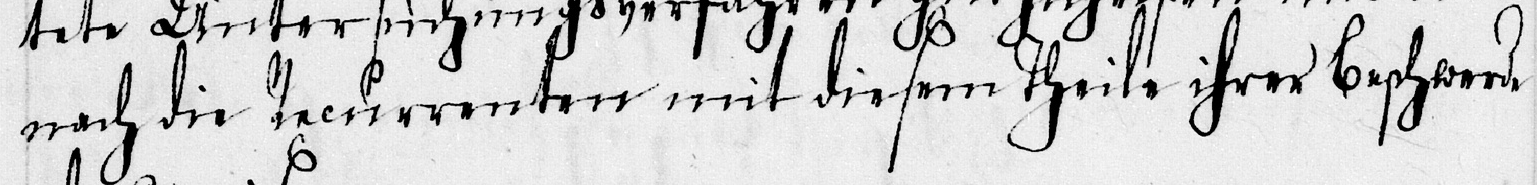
nach die Recurrenten mit diesem Theile ihrer Beschwerde
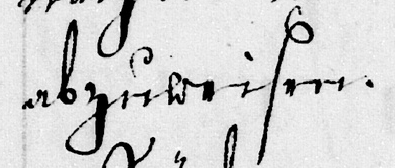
abzuweisen.
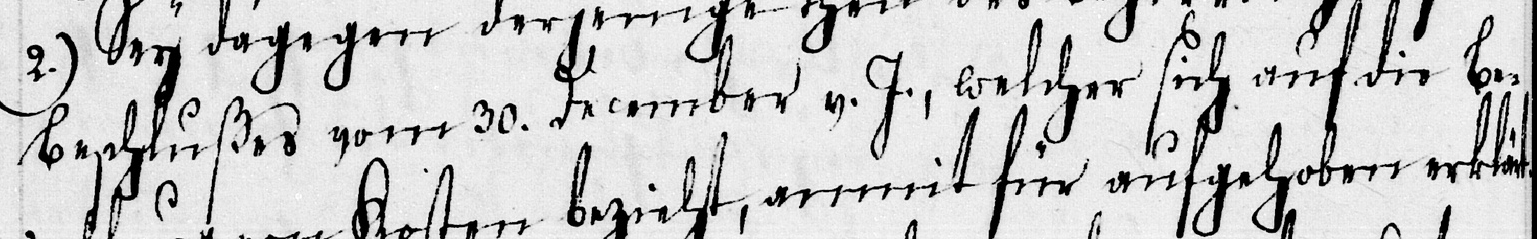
Beschlußes vom 30. December v. J., welcher sich auf die Be¬
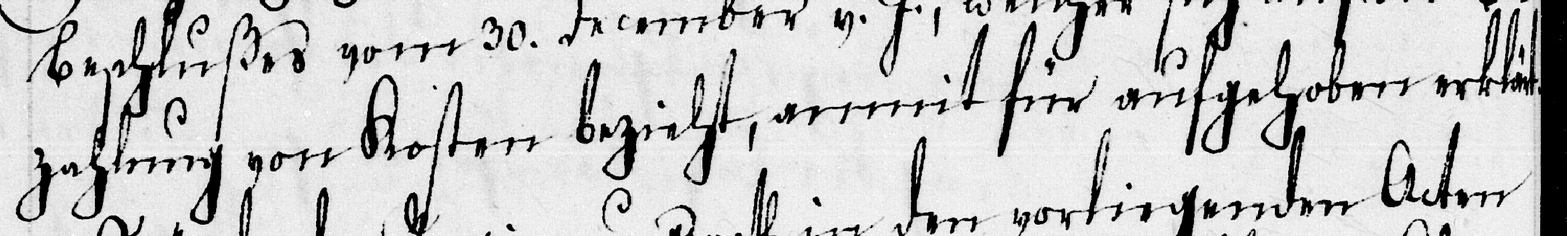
zahlung von Kosten bezieht, anmit für aufgehoben erklärt.
